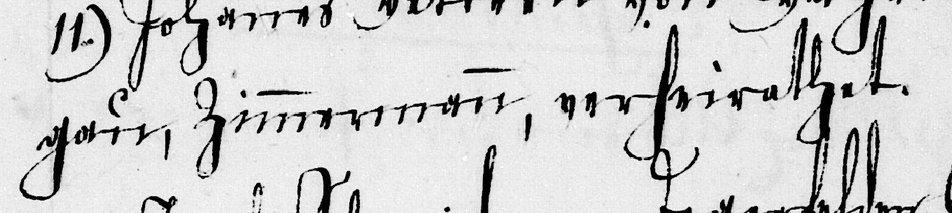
gau, Zimmermann, verheirathet.
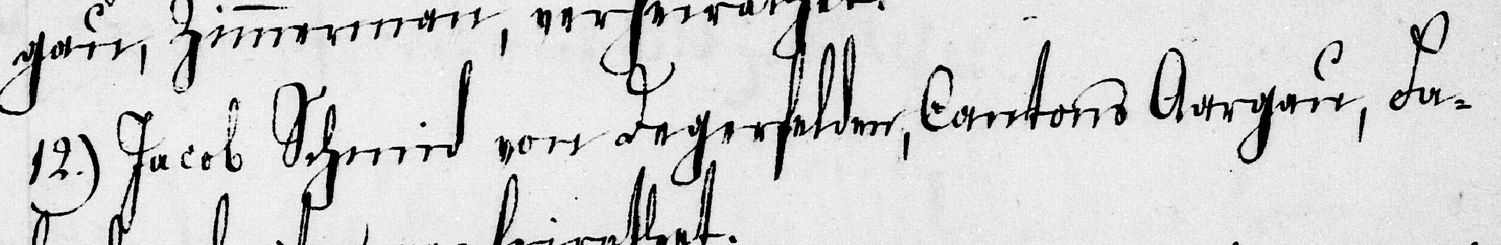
12.) Jacob Schmid von Degerfelden, Cantons Aargau, Fa¬
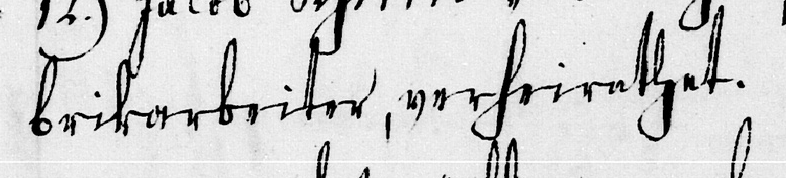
brikarbeiter, verheirathet.
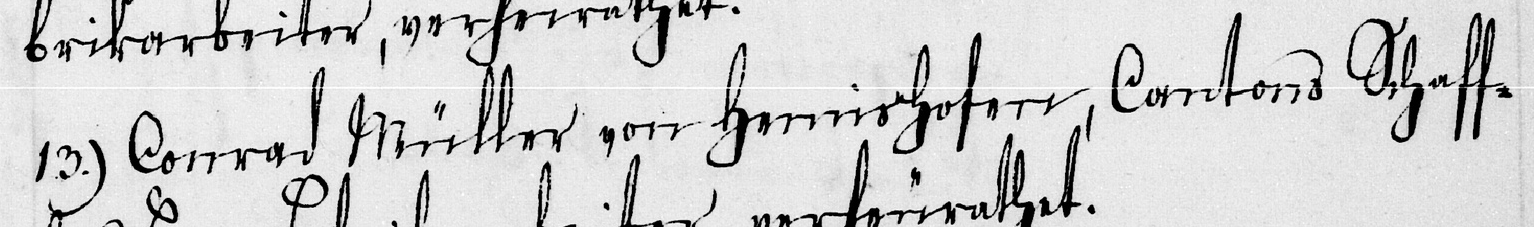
13.) Conrad Müller von Hemishofen, Cantons Schaff¬
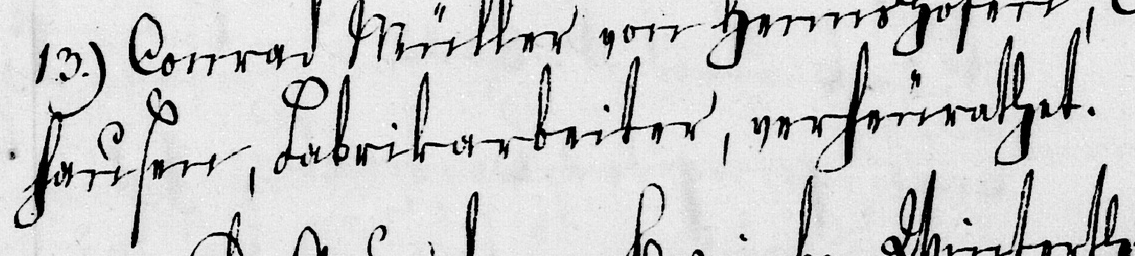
hausen, Fabrikarbeiter, verheurathet.
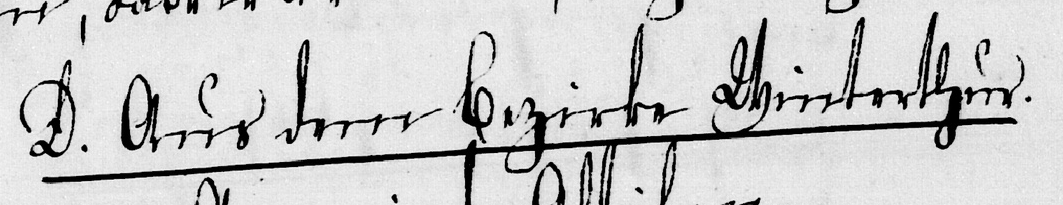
D. Aus dem Bezirke Winterthur.
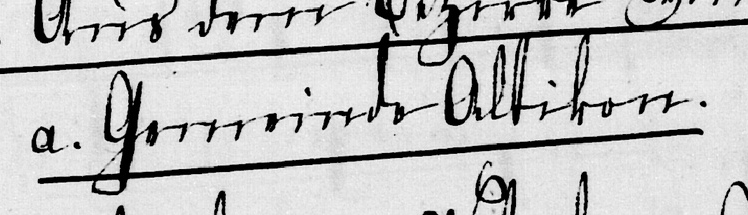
a. Gemeinde Altikon.
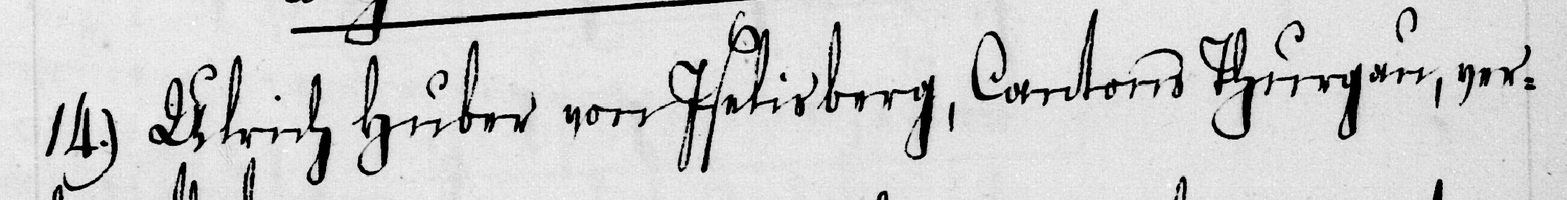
14.) Ulrich Huber von Iselisberg, Cantons Thurgau, ver¬
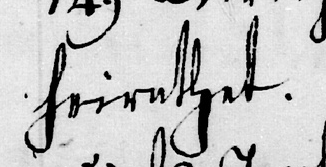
heirathet.
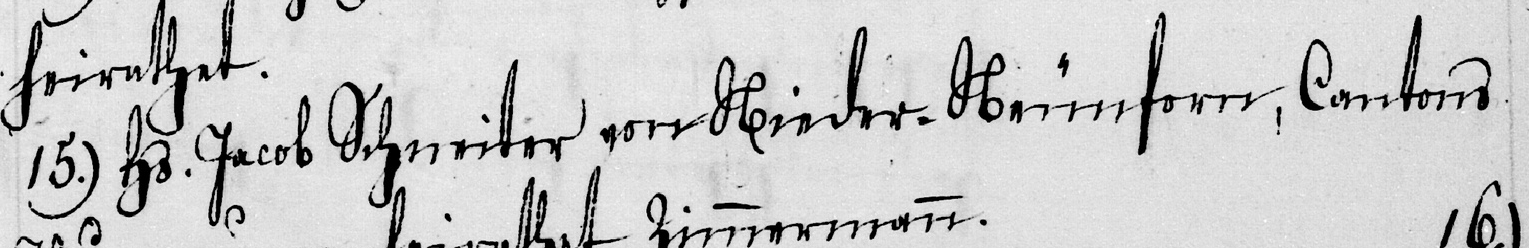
15.) Hs. Jacob Schneiter von Nieder-Neunforn, Cantons
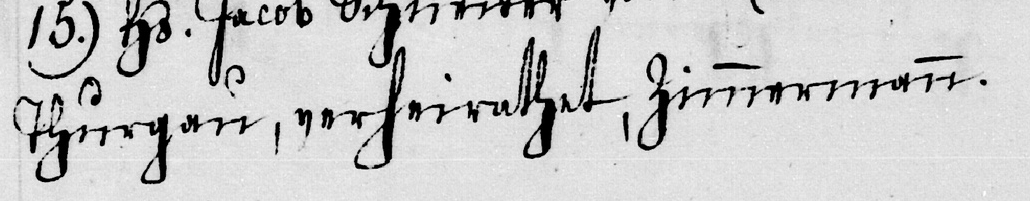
Thurgau, verheirathet, Zimmermann.
